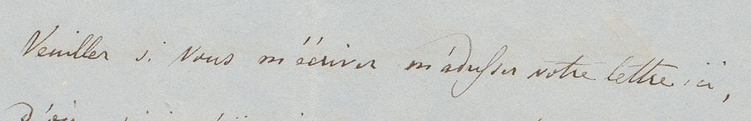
Veuillez si Vous m'écrivez m'adresser votre lettre ici,
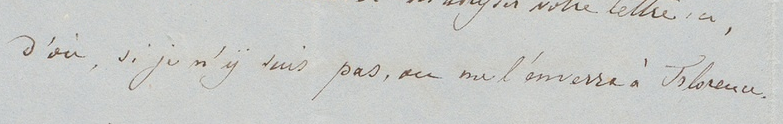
d'où, si je n'y suis pas, on me l'enverra à Florence.
